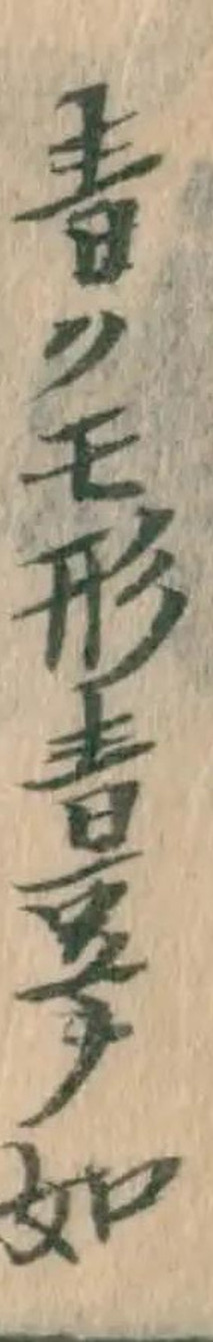青クモ形青豆ノ如
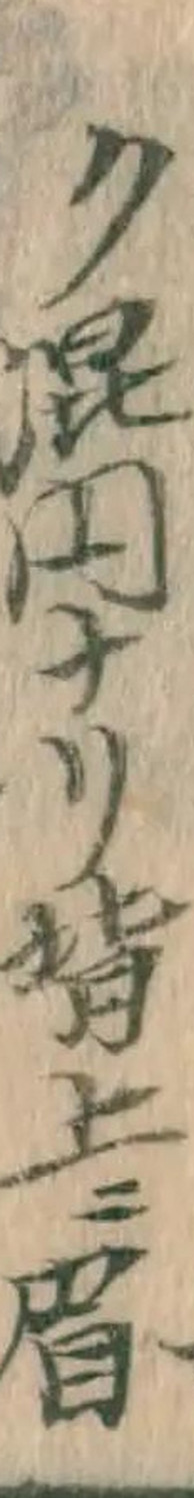ク混円ナリ背上ニ眉
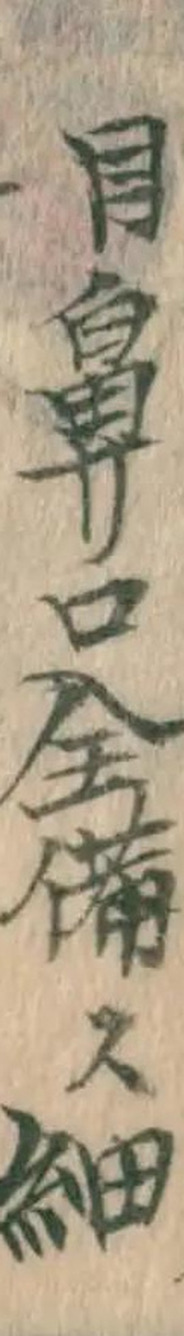目鼻口全備ス細
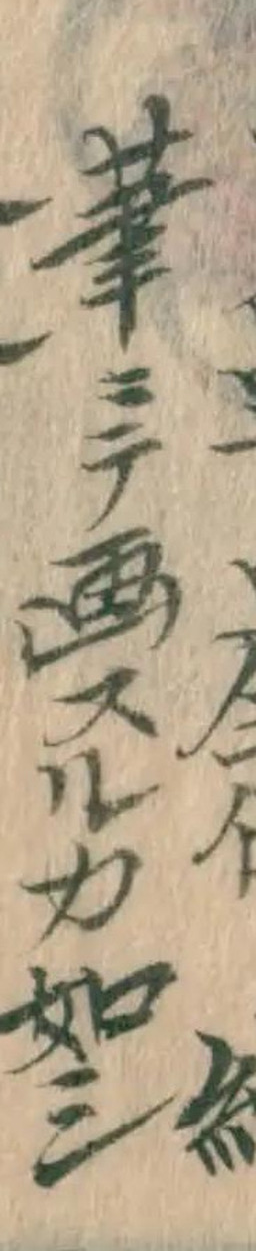筆ニテ画スルカ如シ
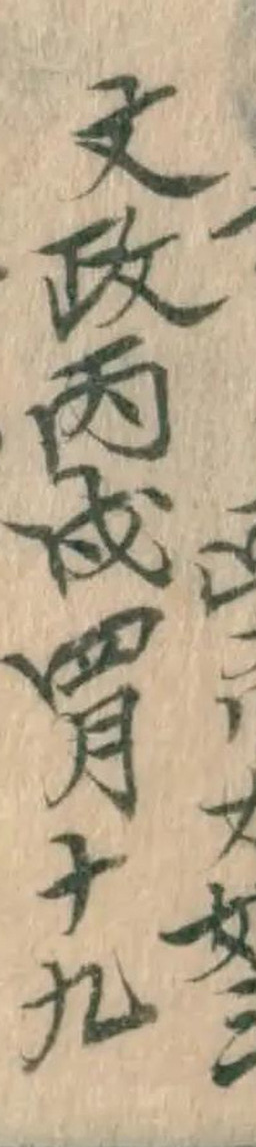文政丙戌四月十九
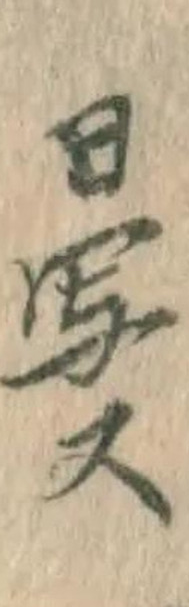日写ス
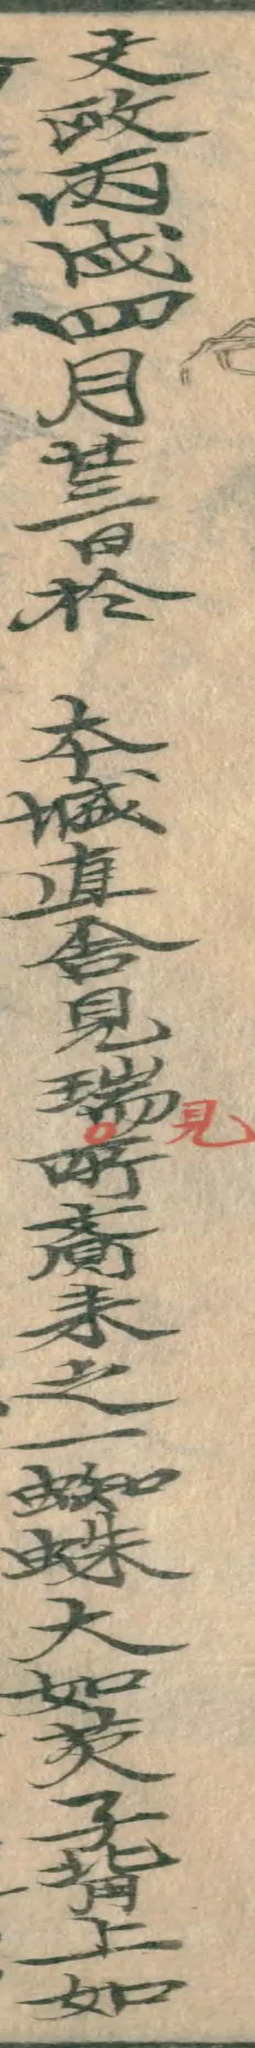文政丙戌四月廿三日於本城直舎見端◦所斎来之一蜘蛛大如芡子背上如
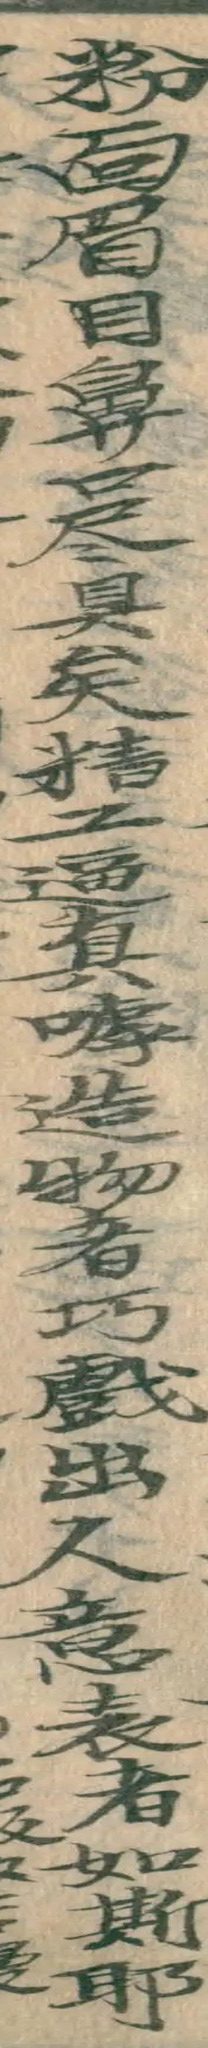粉面眉目鼻口尽具矣精工逼真嘑造物者巧戯出人意表者如斯耶

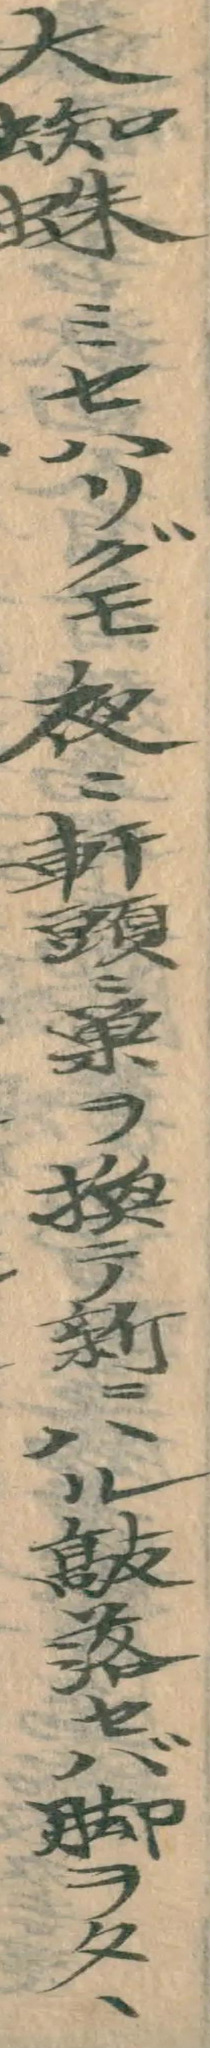大蜘蛛ミセハリグモ夜ニ軒頭ニ巣ヲ換テ新ニハル敲落セバ脚ヲタヽ
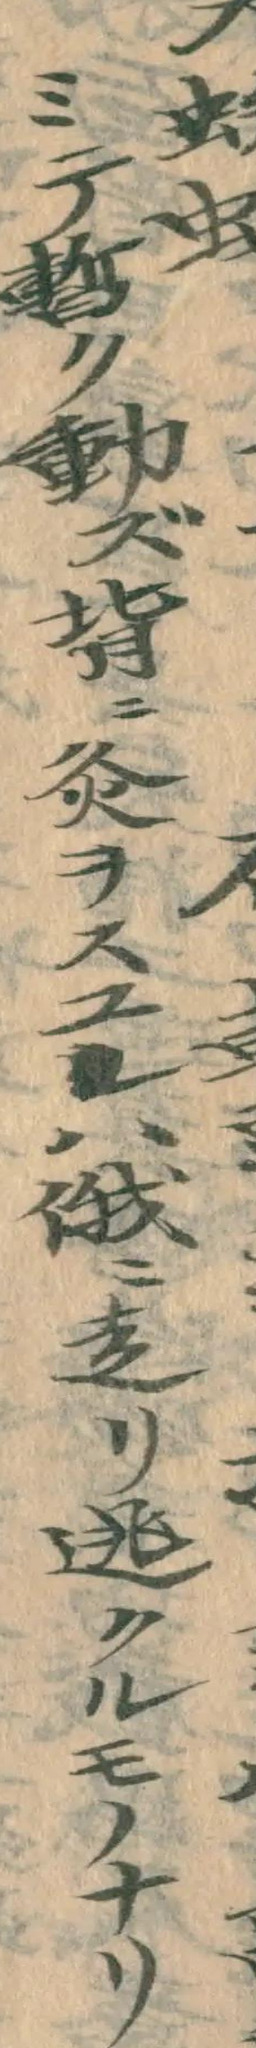ミテ暫ク動ズ背ニ灸ヲスユレハ俄ニ走リ逃クルモノナリ
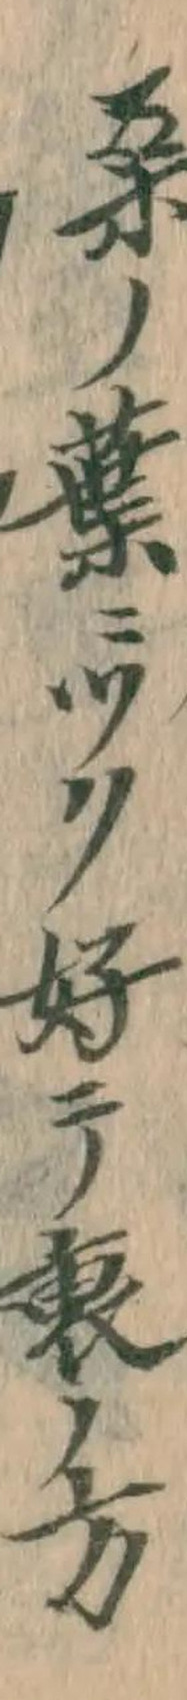桑ノ葉ニツク好テ裏ノ方
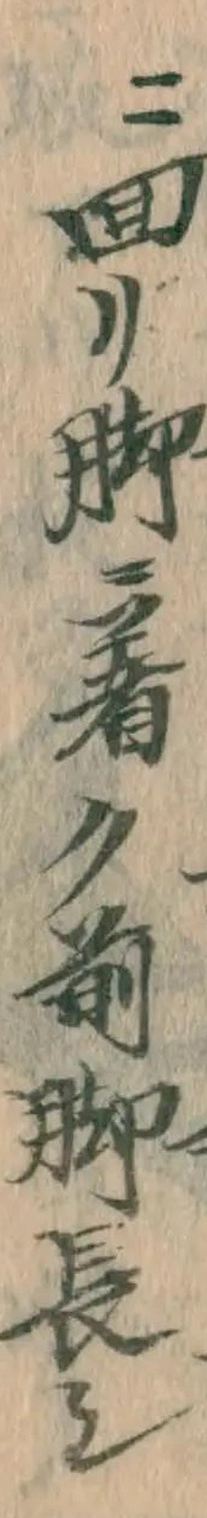ニ回リ脚ニ着ク前脚長シ

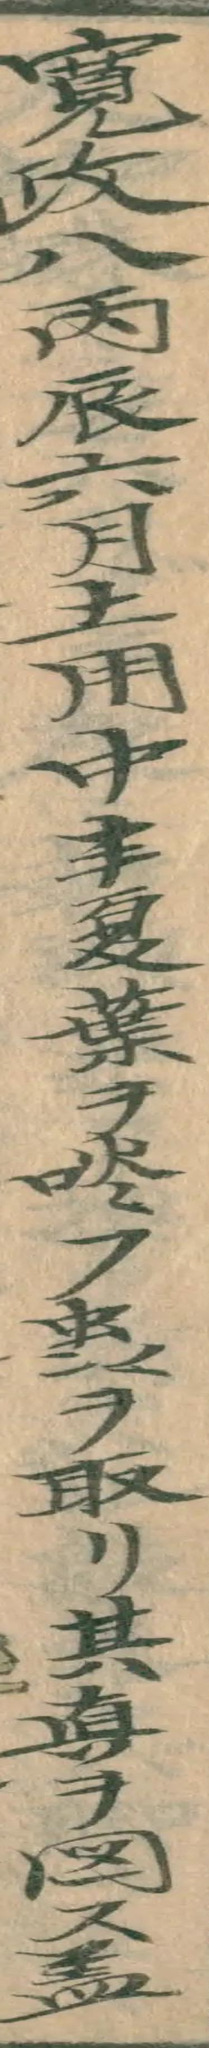寛政八丙辰六月土用中半夏葉ヲ啖フ蟲ヲ取リ其眞ヲ図ス蓋
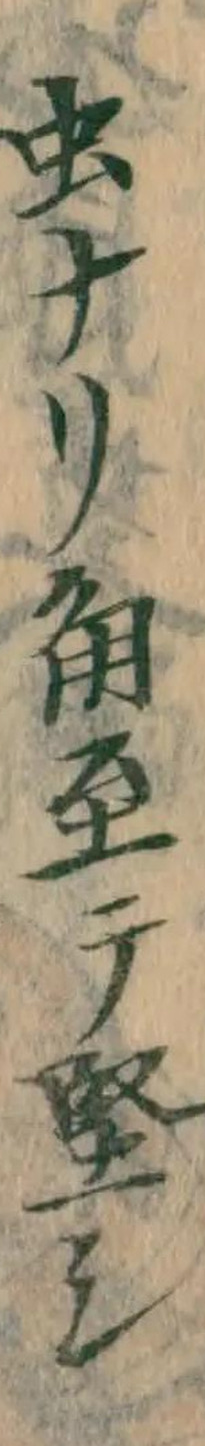虫ナリ角至テ堅シ
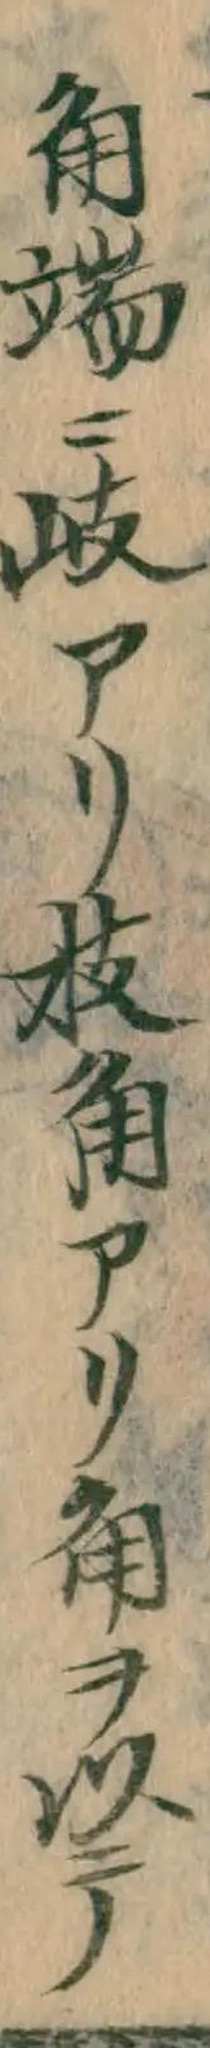角端ニ岐アリ枝角アリ角ヲ以テ
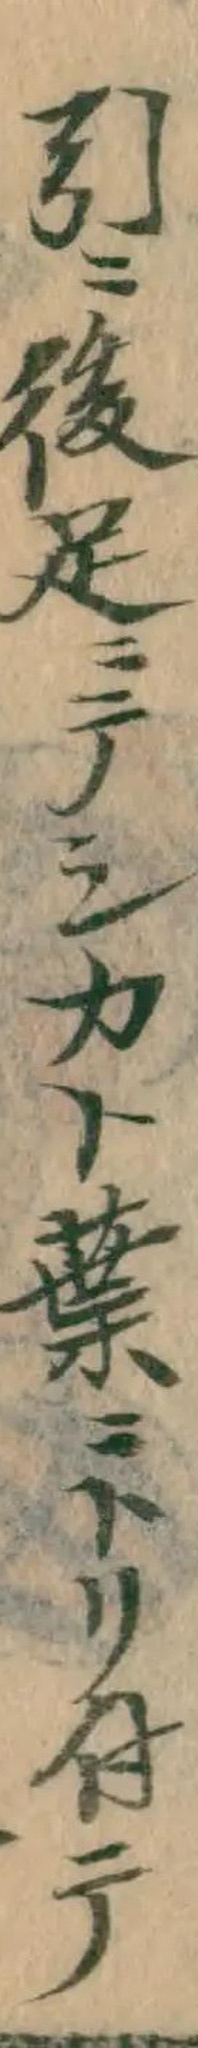引ニ後足ニテシカト葉ニトリ付テ
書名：千蟲譜 3巻. [2]
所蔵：国立国会図書館 National Diet Library, JAPAN
